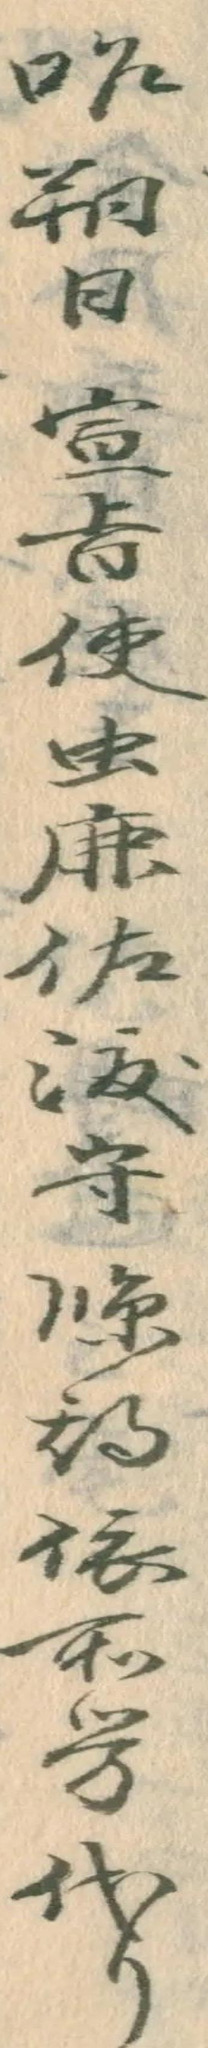昨朔日宣旨使虫鹿佐渡守臨期依所労代り
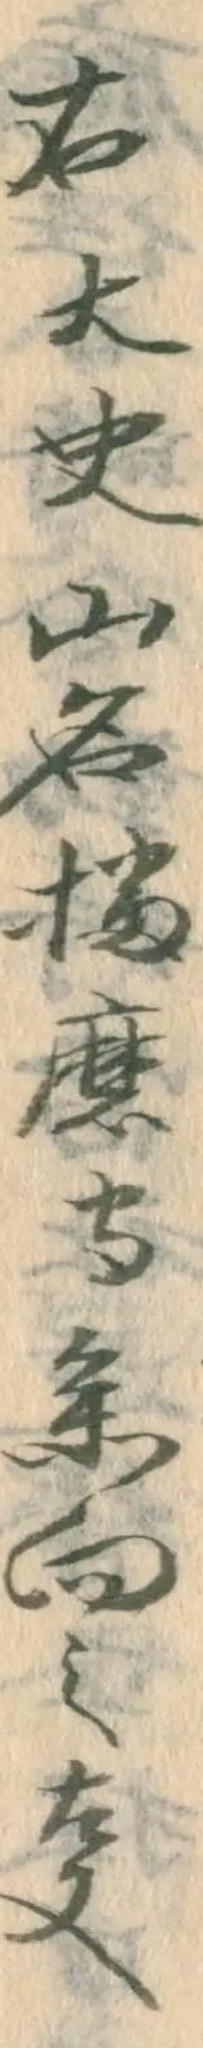右大史山名播磨守参向之事
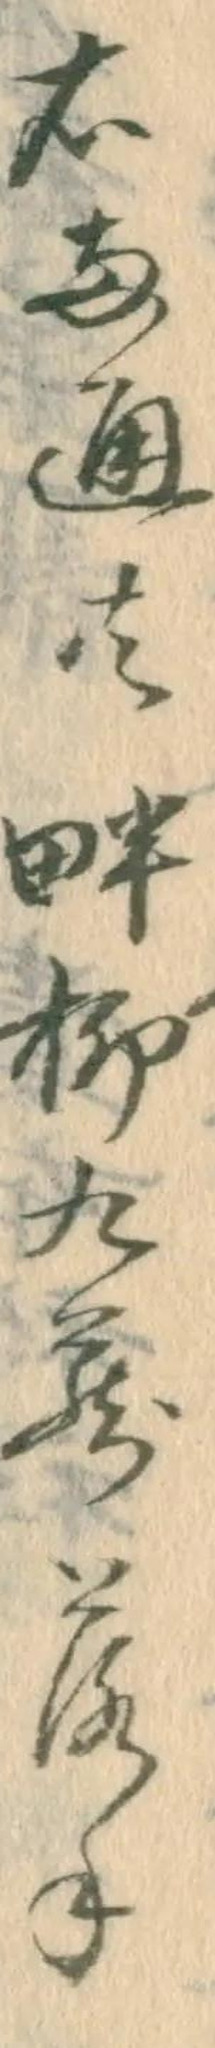右両通共畔柳九蔵落手
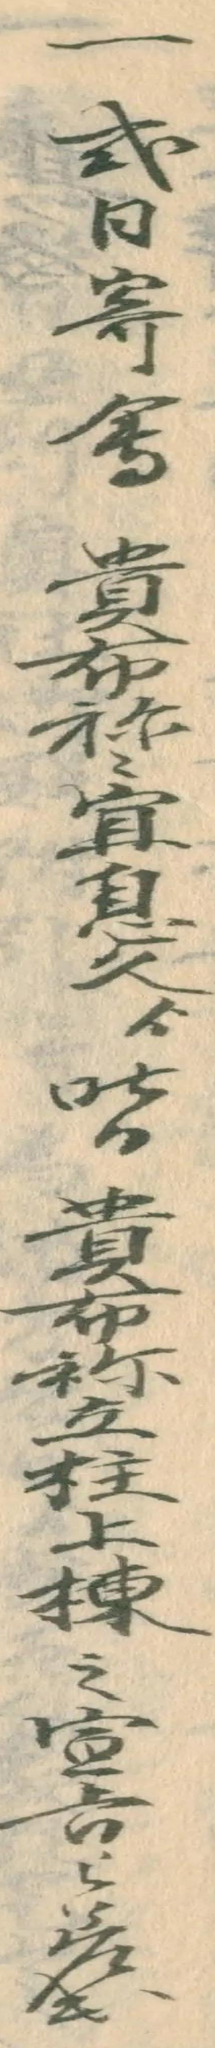一式日寄会貴布祢々宜息久ゟ昨日貴布祢立柱上棟之宣旨被差出

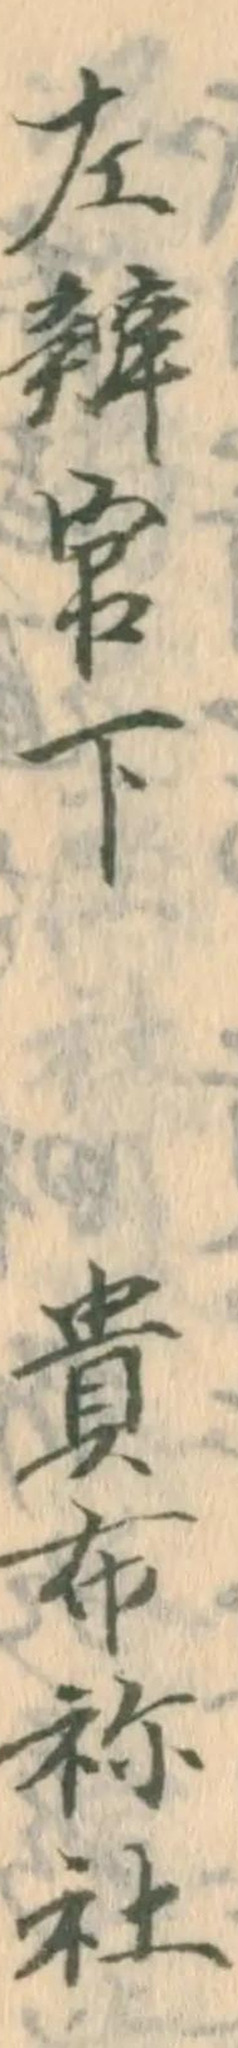左弁官下貴布祢社
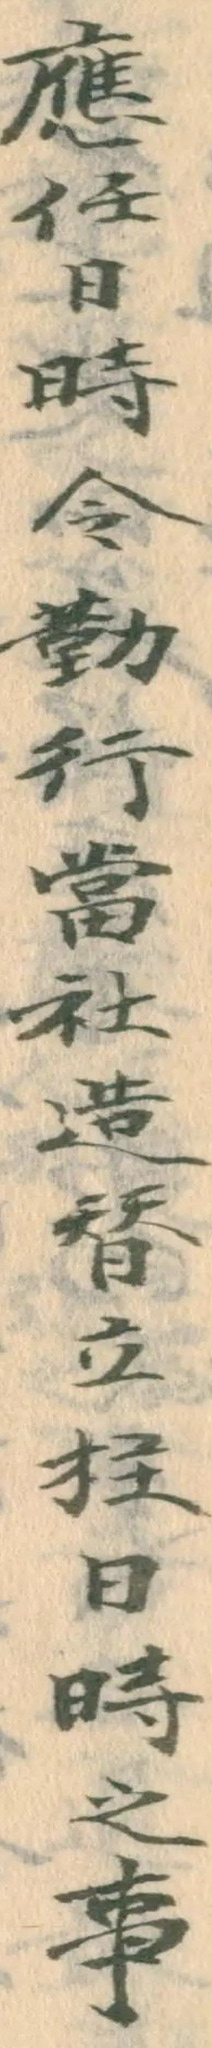応任日時令勤行当社造替立柱日時之事
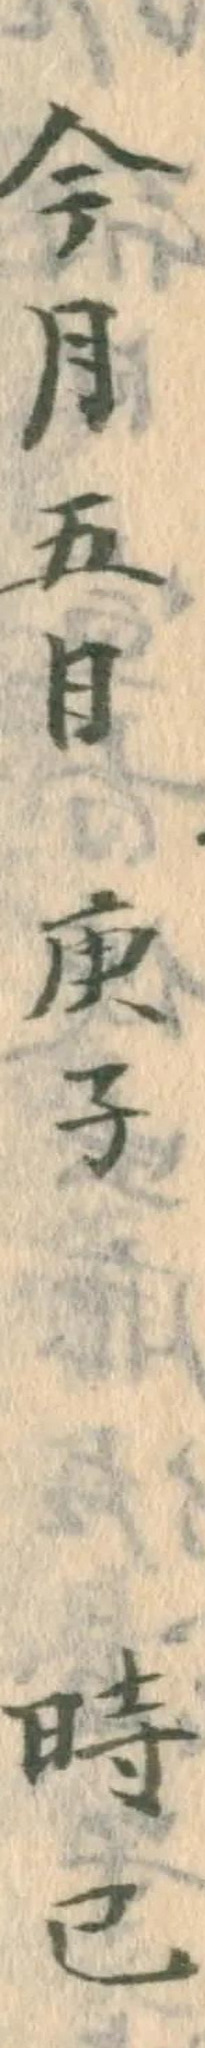今月五日庚子時巳
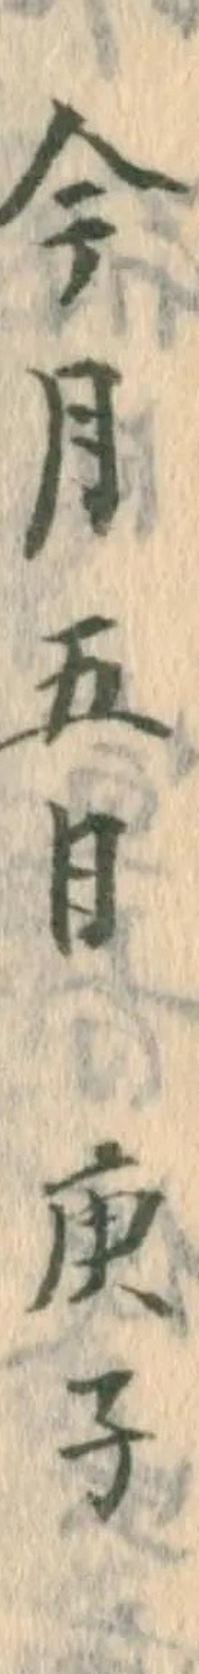今月五日庚子時巳
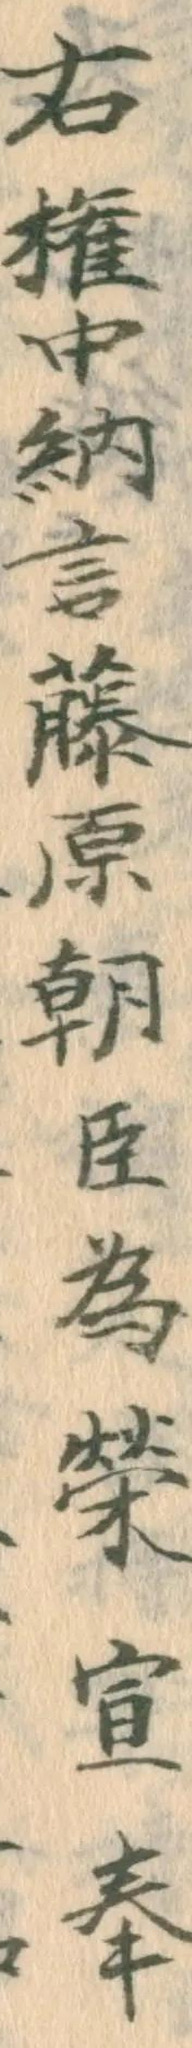右権中納言藤原朝臣為栄宣奉
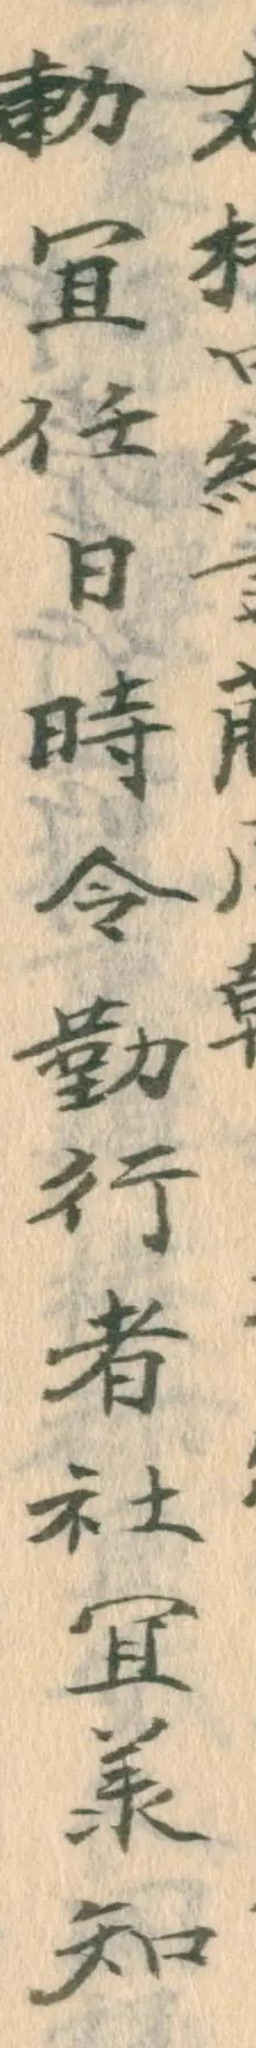勅宜任日時令勤行は社宜承知
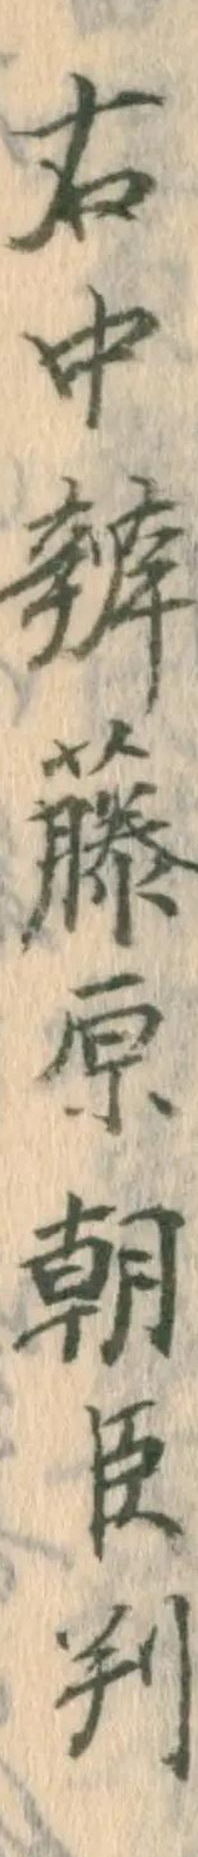右中弁藤原朝臣判
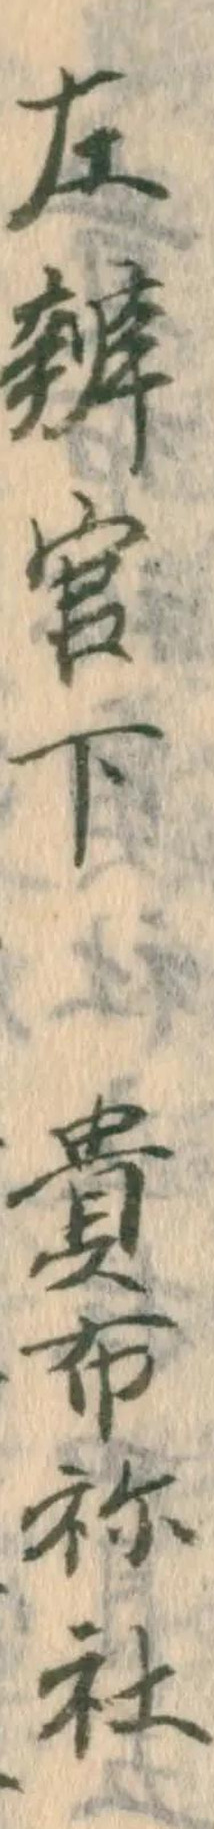左弁官下貴布祢社
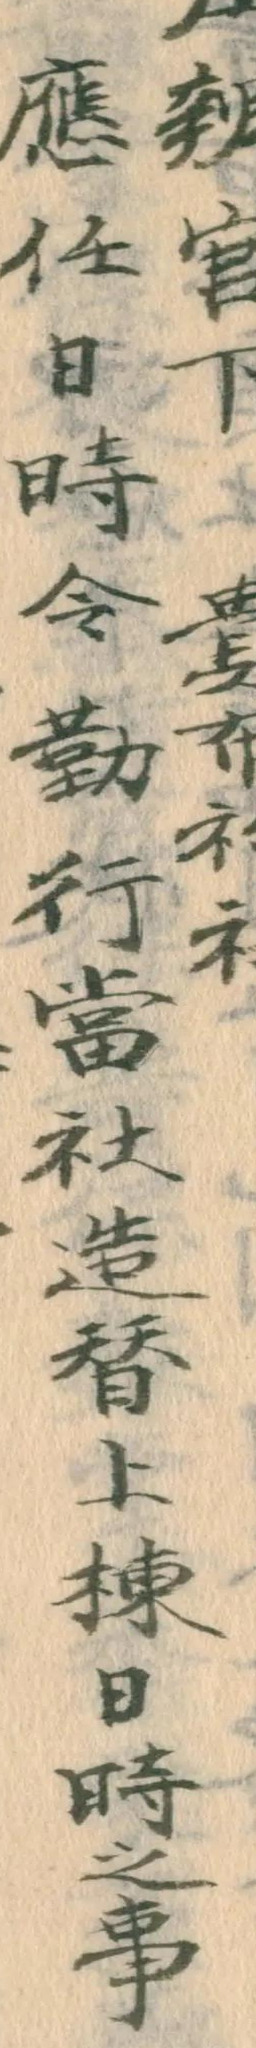応任日時令勤行当社造替上棟日時之事
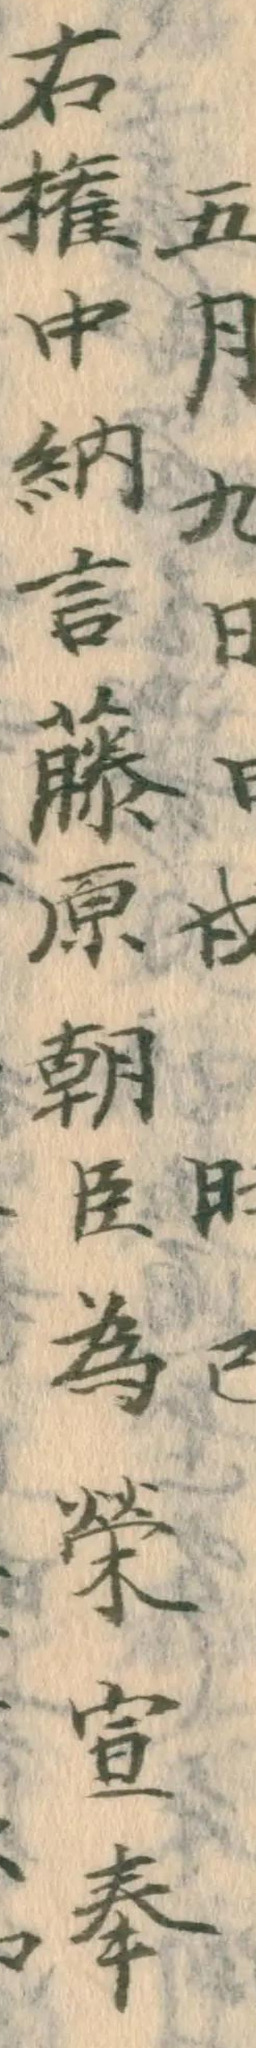右権中納言藤原朝臣為栄宣奉
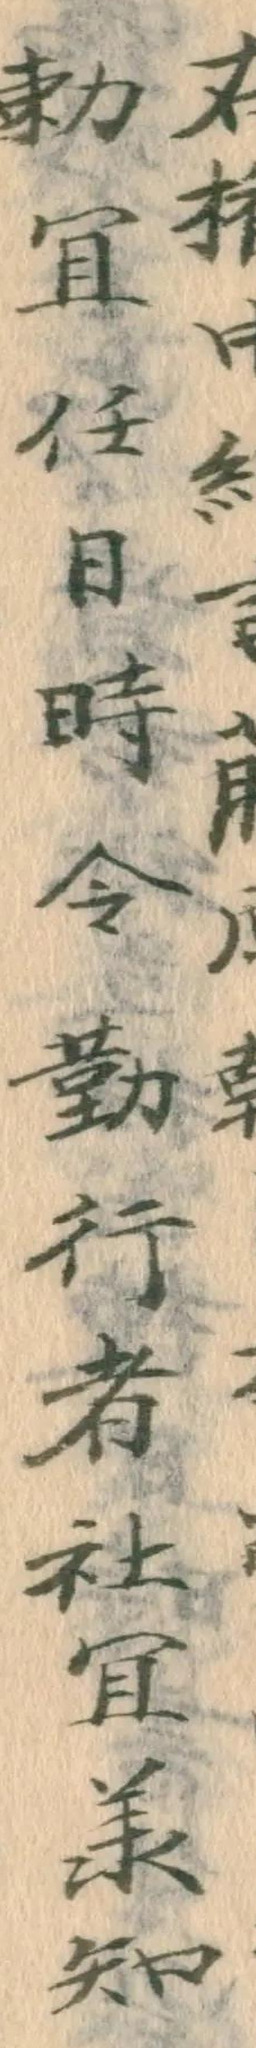勅宜任日時令勤行は社宜承知
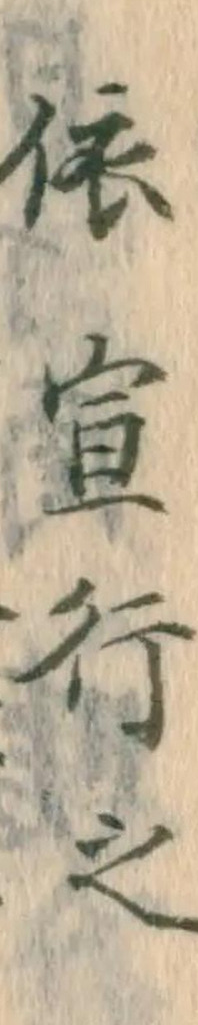依宣行奉
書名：賀茂社記録. 第17冊
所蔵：国立国会図書館 National Diet Library, JAPAN
